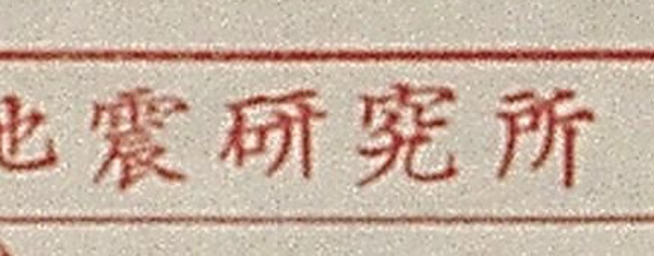地震研究所
